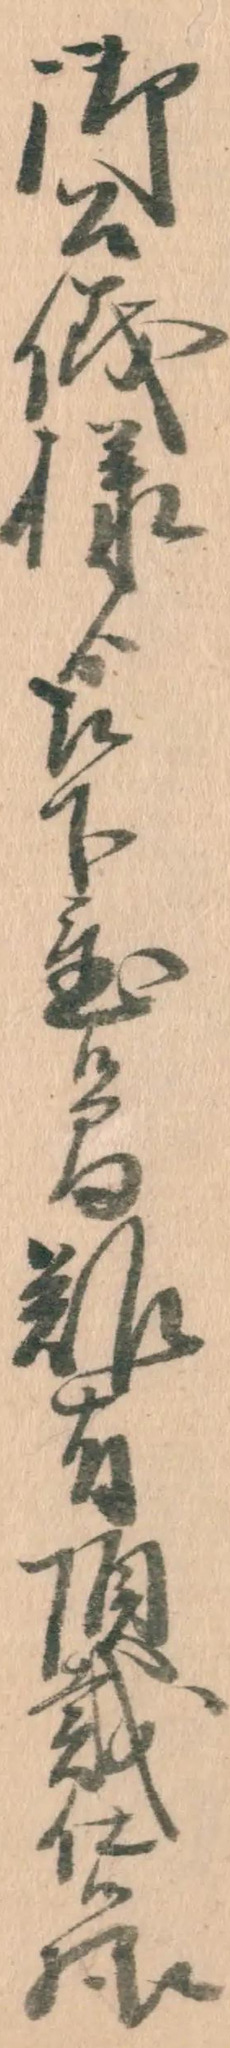御公儀様ゟ被下置候間難有頂戴仕候様
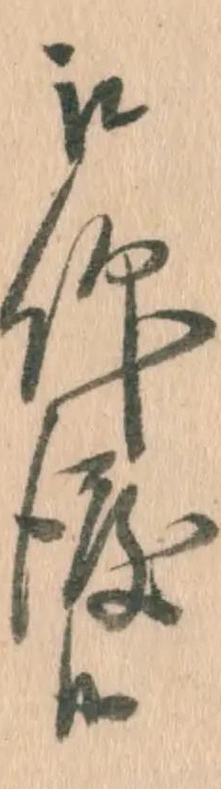被仰渡候

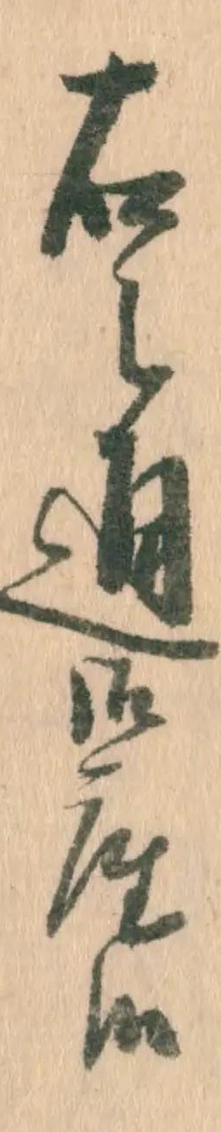右之通御座候
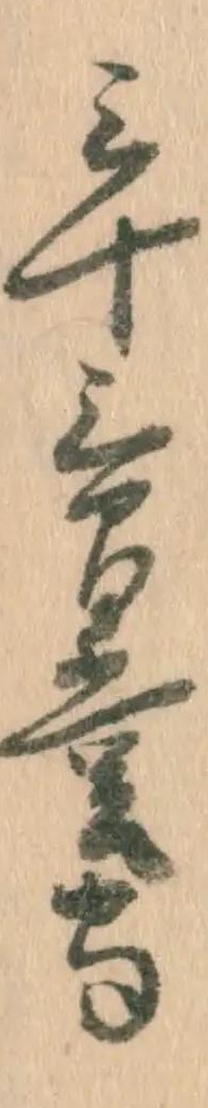三十三間堂守
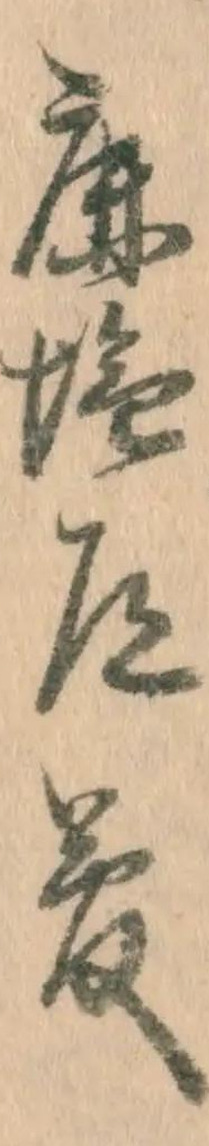鹿塩道菅
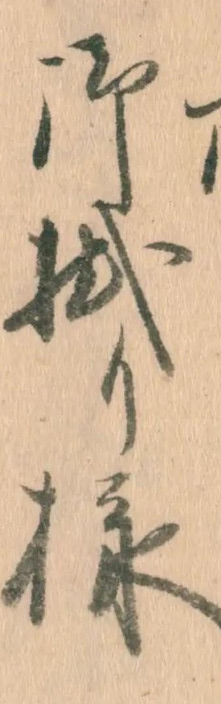御掛り様
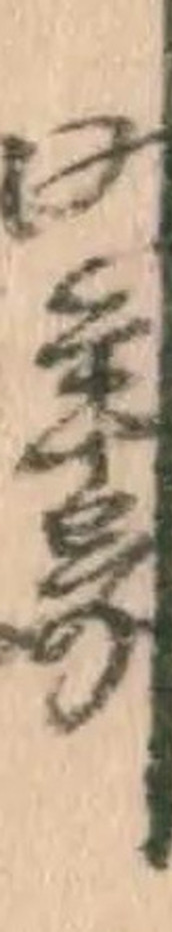町年寄
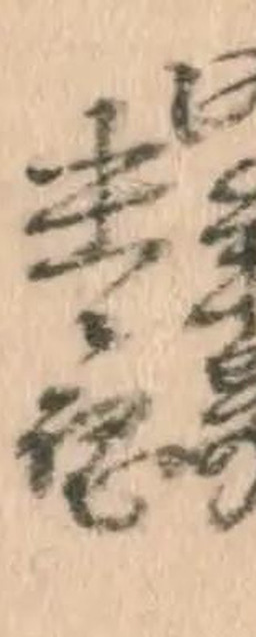末ニ認
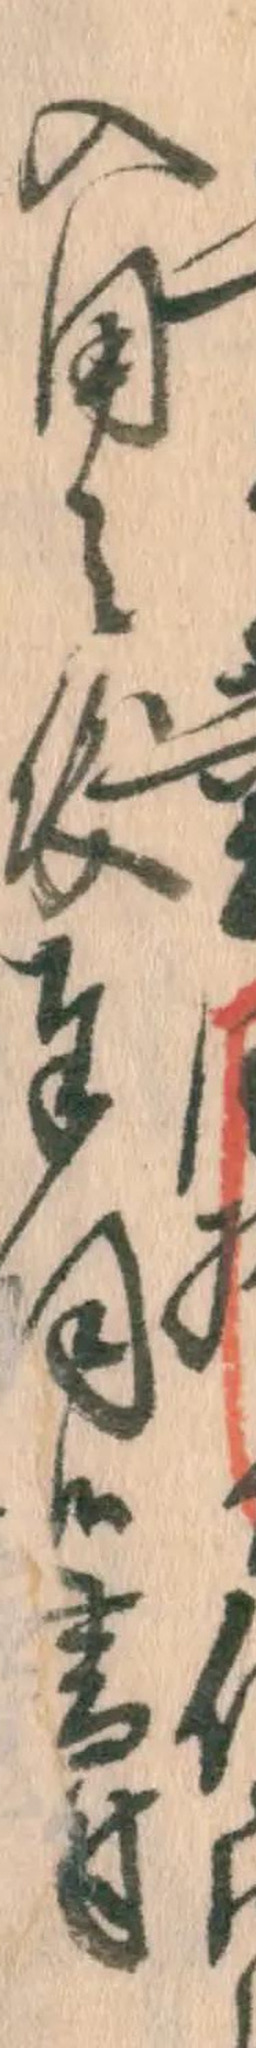入用之儀奉伺候書付
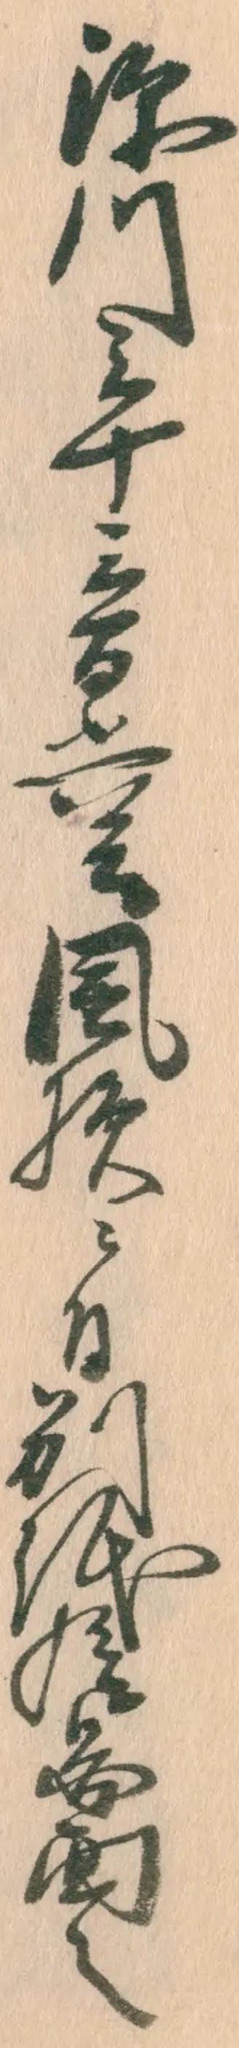深川三十三間堂風損に付別紙絵図面之
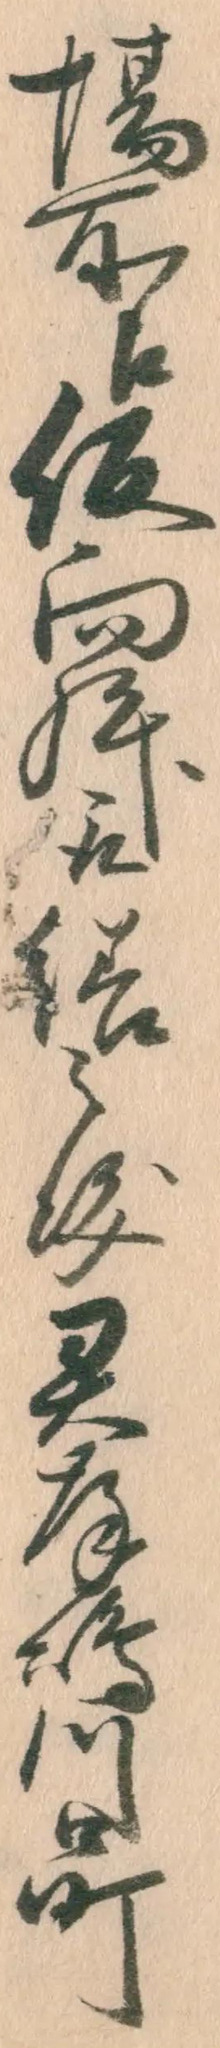場所え仮向拝取繕之儀霊岸嶋川口町

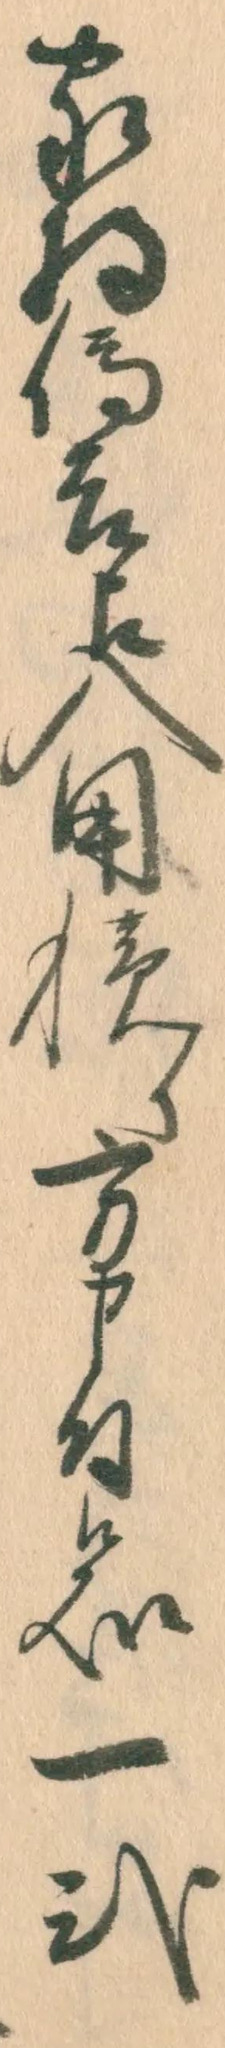家持伝吉え入用積り方申付候処一式
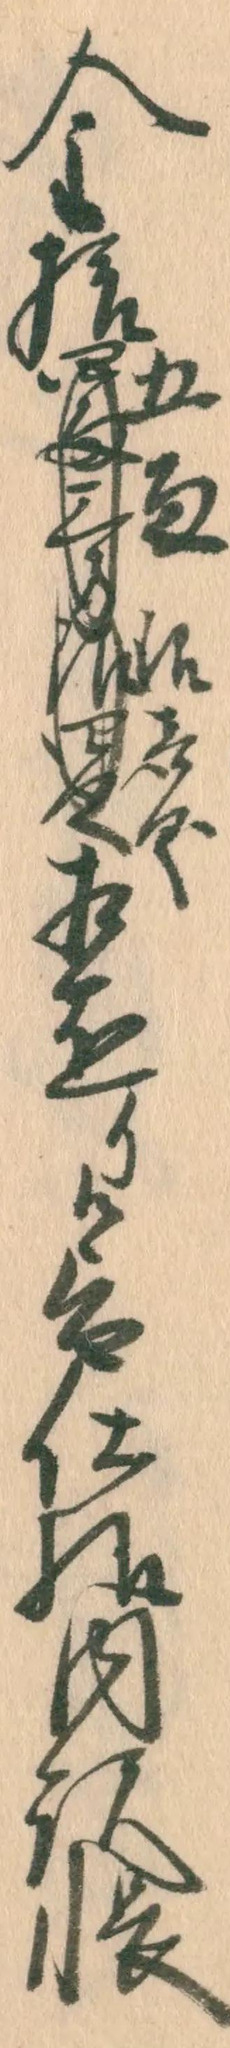金拾五両銀六匁相懸り候旨仕様内訳帳
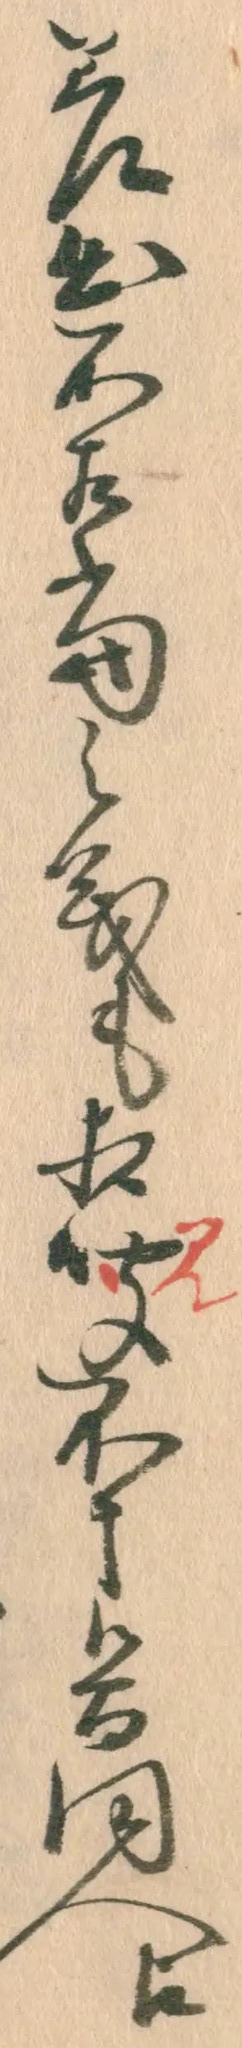差出不相当之義も相見不申候間同人え
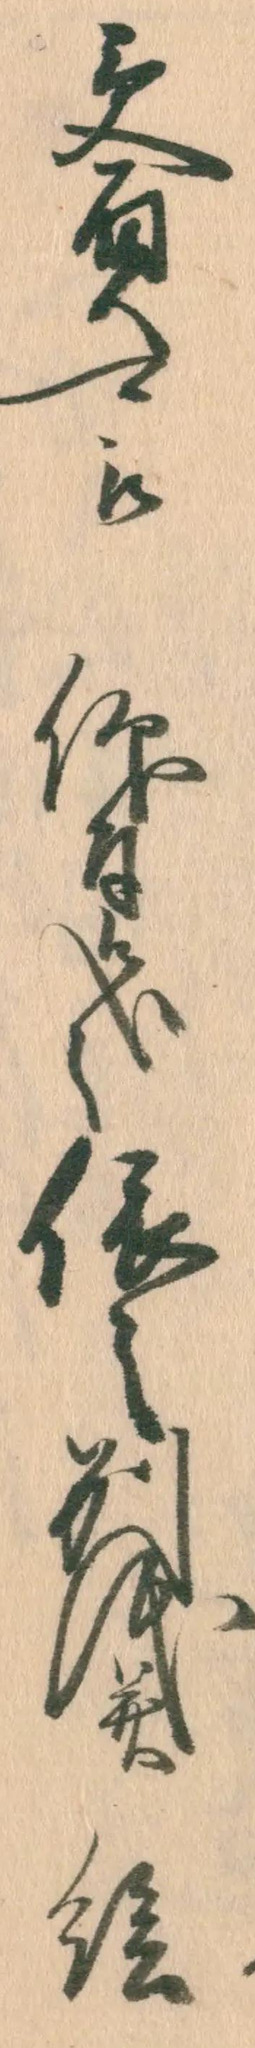受負可被仰付候哉依之別紙并絵
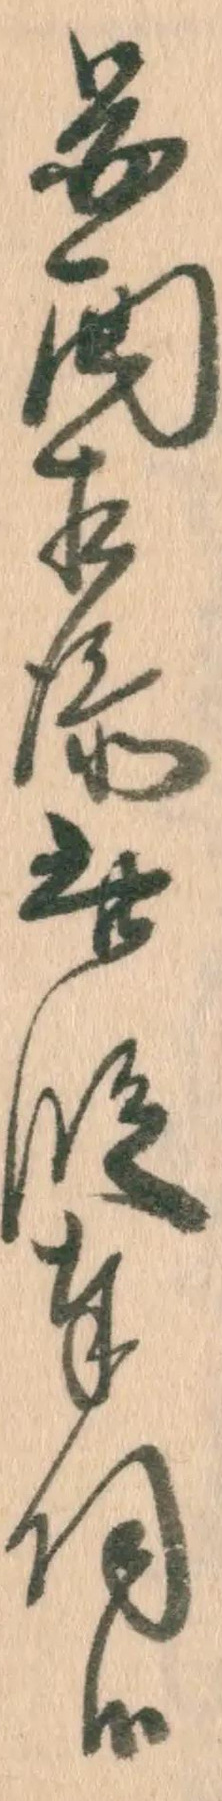図面相添此段奉伺候
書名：三十三間堂. [1]
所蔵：国立国会図書館 National Diet Library, JAPAN
